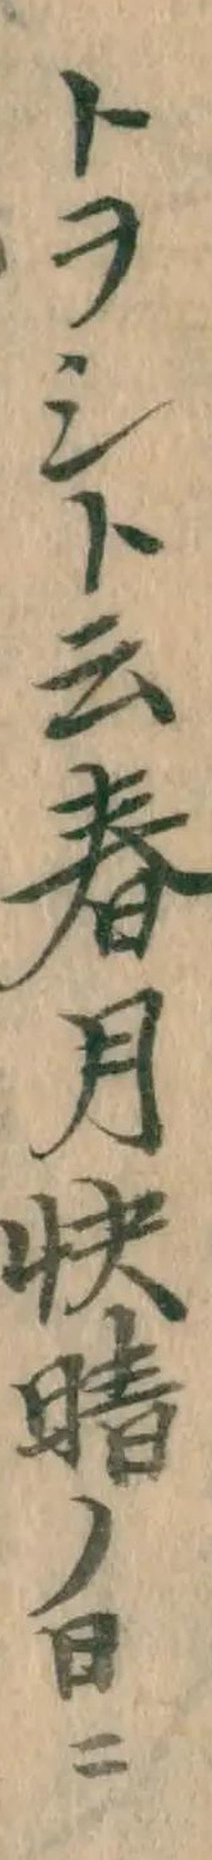トヲシト云春月快晴ノ日ニ
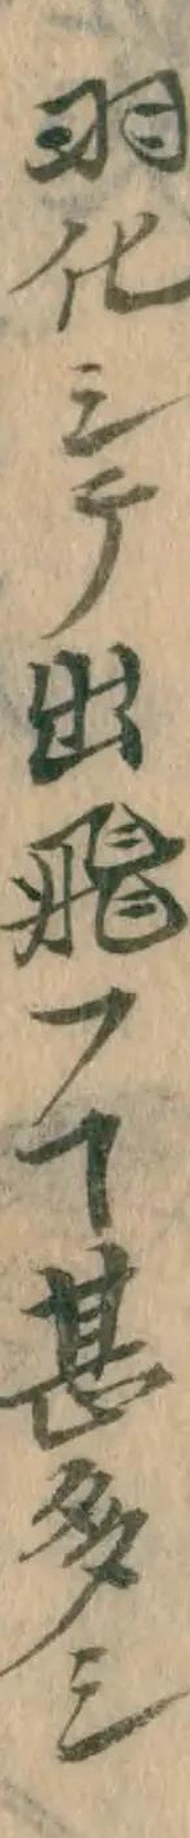羽化シテ出飛フコト甚多シ
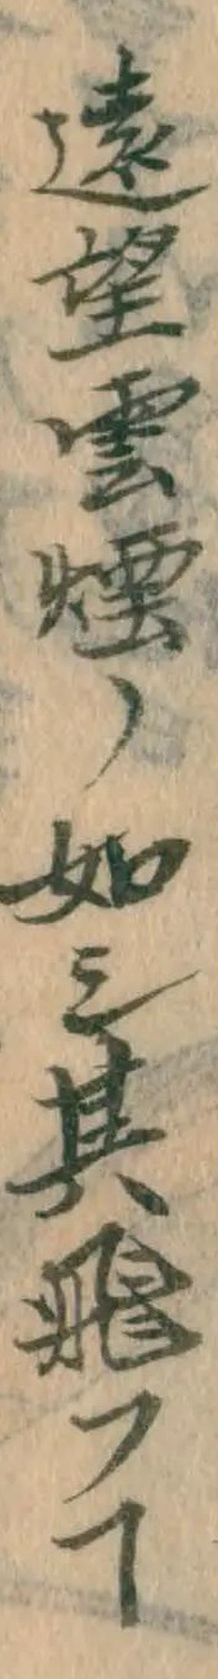遠望雲煙ノ如シ其飛フコト
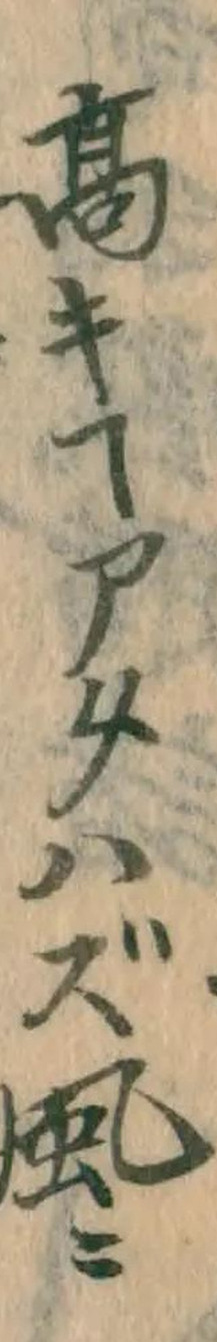髙キコトアタハズ風ニ
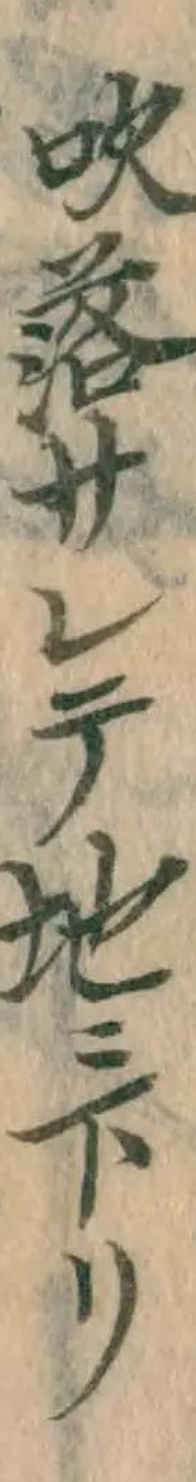吹落サレテ地ニ下リ
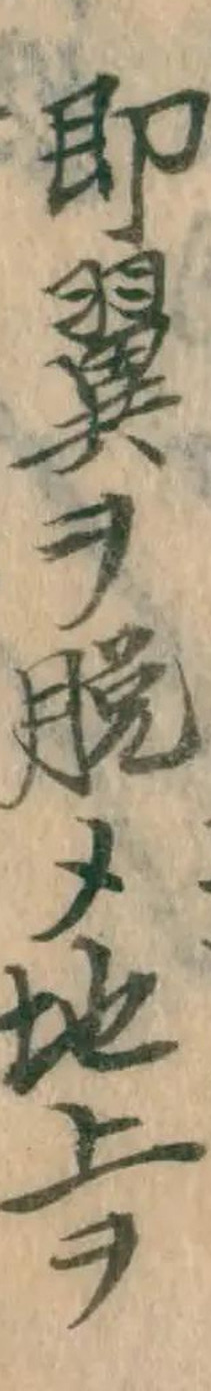即翼ヲ脱シテ地上ヲ
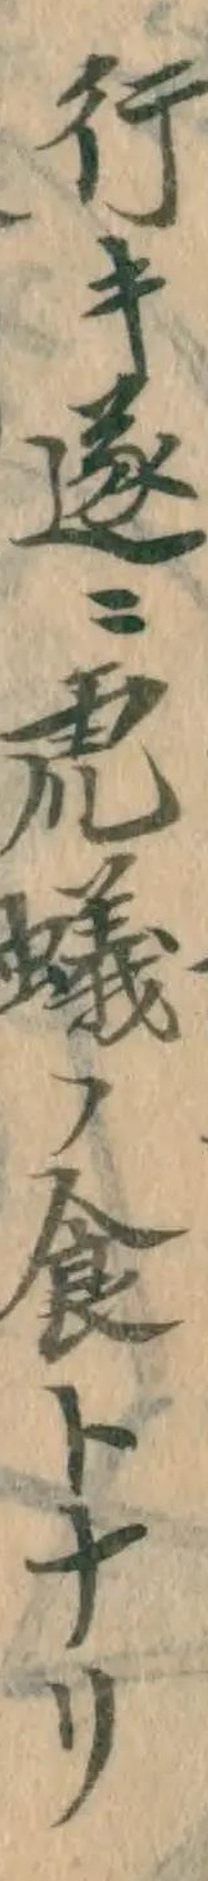行キ遂ニ虎蟻ノ食トナリ
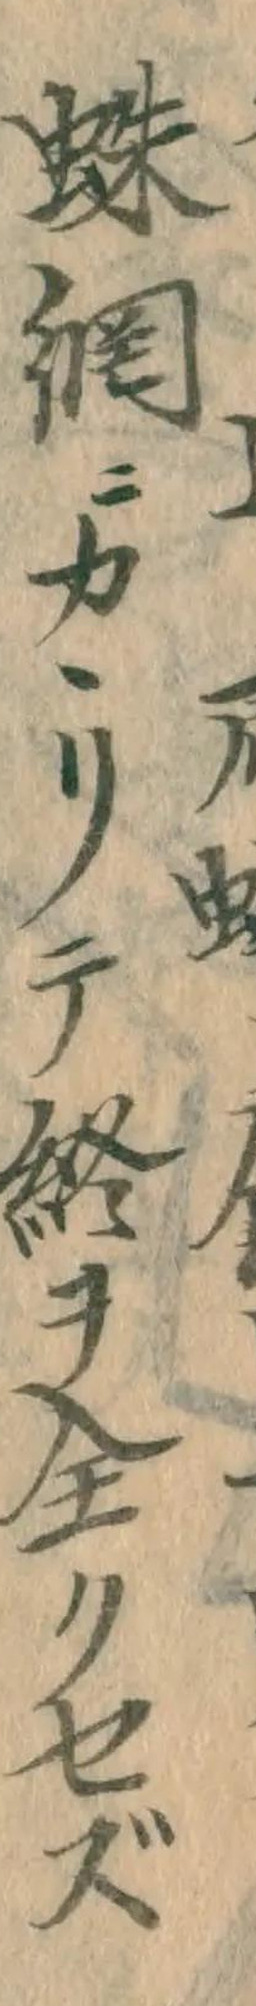蛛網ニカヽリテ終ヲ全クセズ
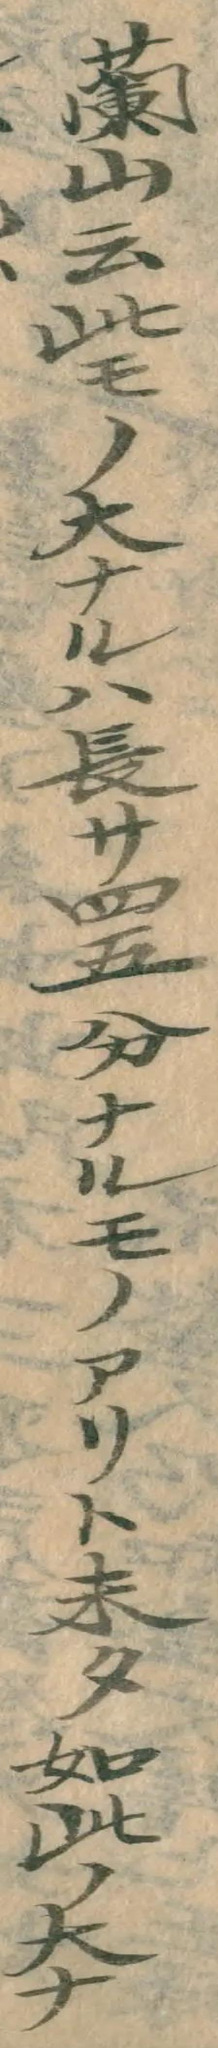蘭山云此モノ大ナルハ長サ四五分ナルモノアリト未タ如此大ナ
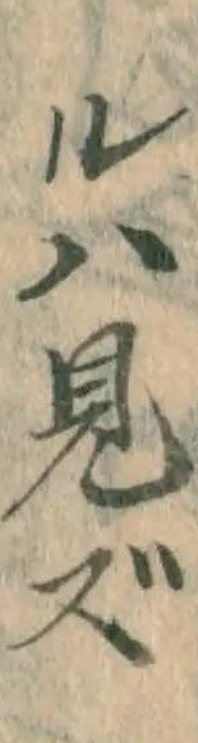ルハ見ズ

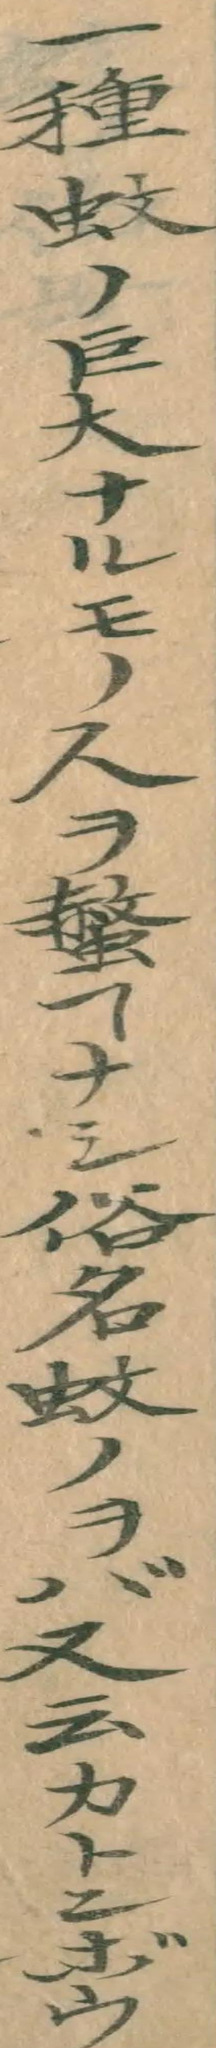一種蚊ノ巨大ナルモノ人ヲ螫コトナシ俗名蚊ノヲバ又云カトンボウ
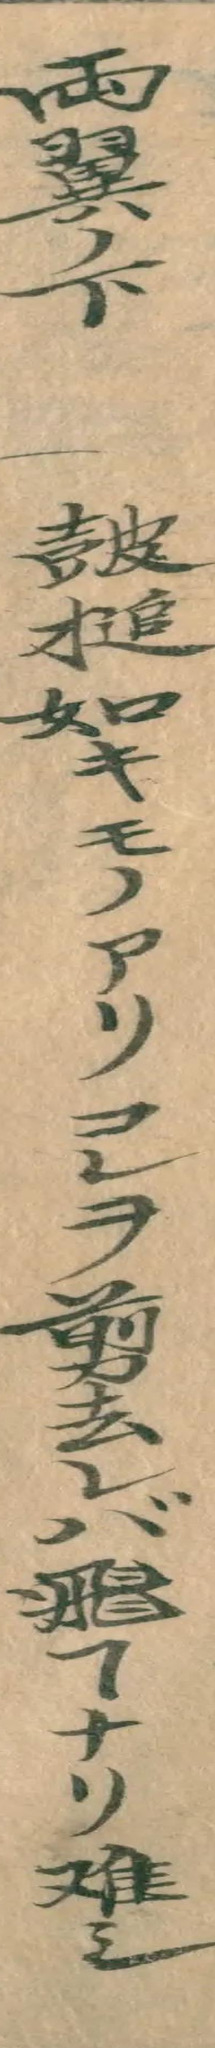両翼ノ下皷槌如キモノアリコレヲ剪去レバ飛コトナリ難シ
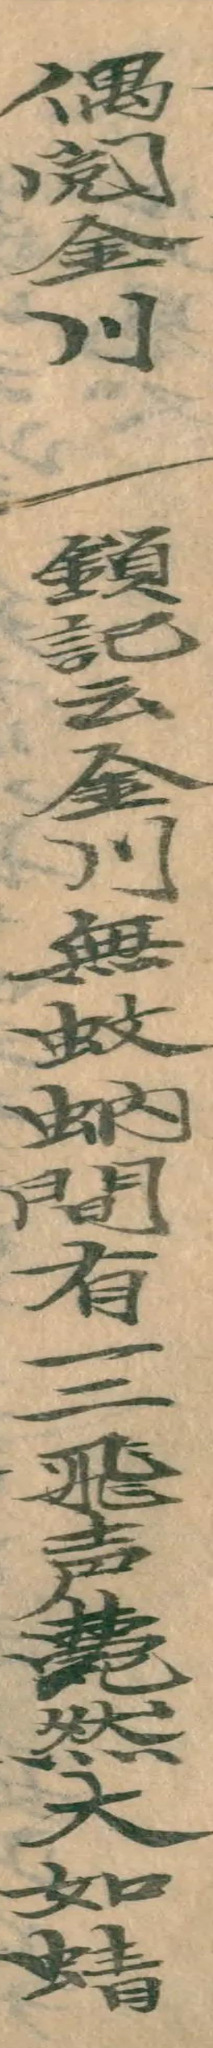偶閲金川鎖記云金川無蚊蚋間有一ニ飛声薨然大如蜻
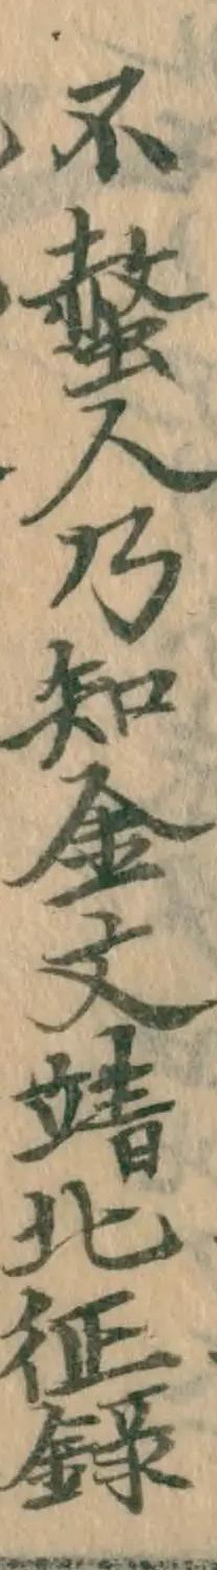蜒不螫人乃知金文靖北征録
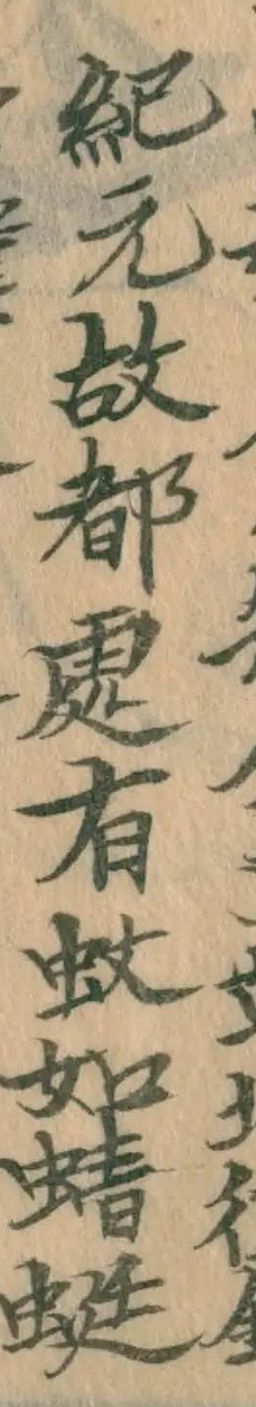中紀元故都處有蚊如蜻蜒
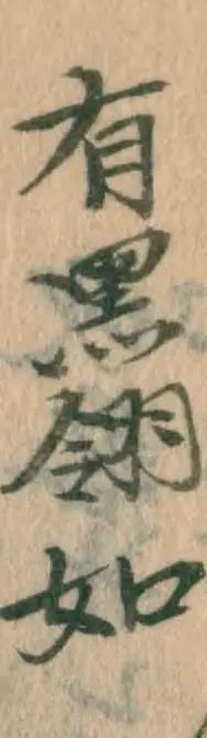有黒翎如
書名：千蟲譜 3巻. [2]
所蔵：国立国会図書館 National Diet Library, JAPAN
